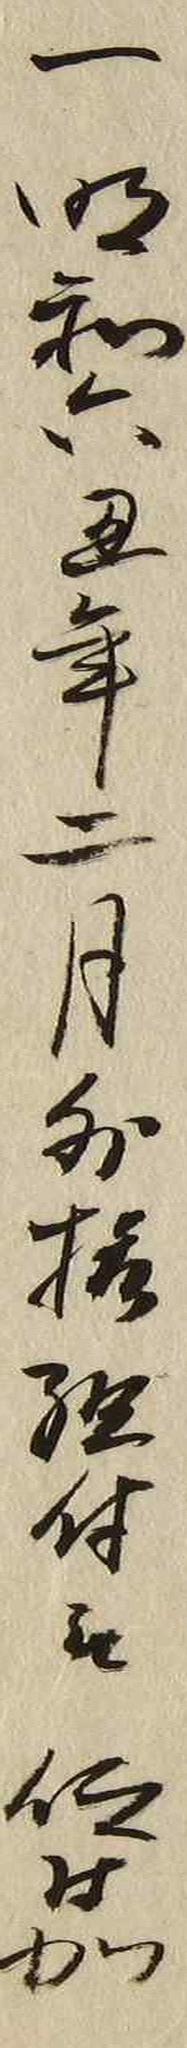一明和六丑年二月外様組付被仰付加
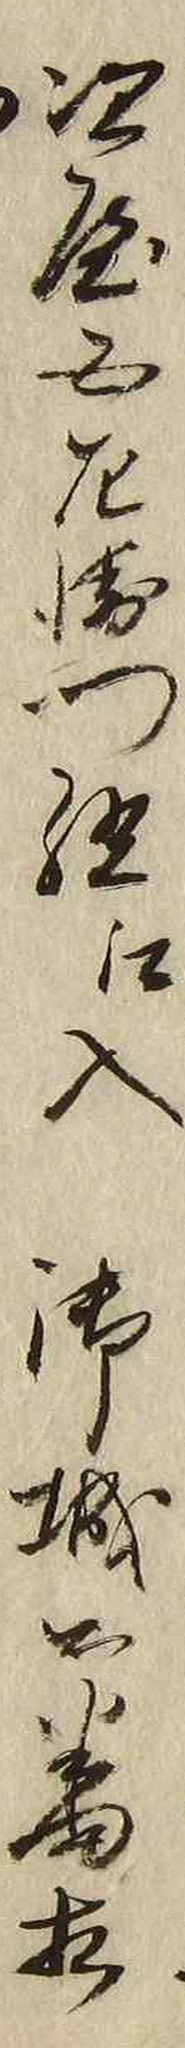次屋五左衛門組江入御城小番相
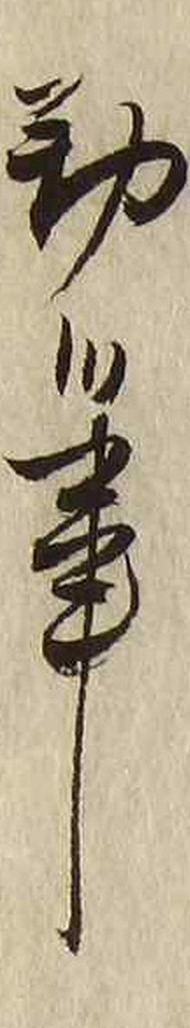勤候事

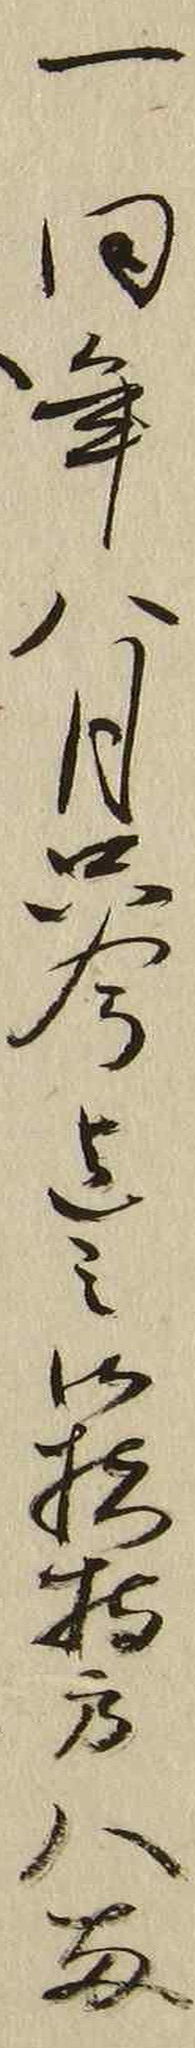一同年八月只今迄之御扶持方八両
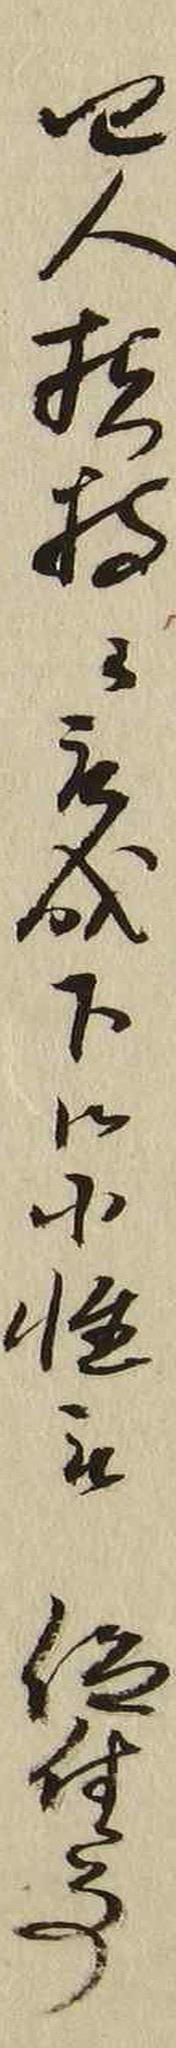四人扶持ニ被成下御小性被仰付候事
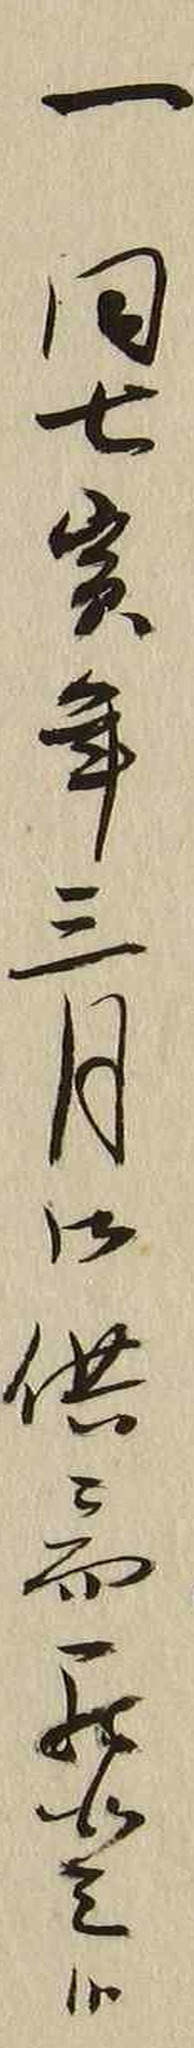一同七寅年三月御供ニ而罷登候
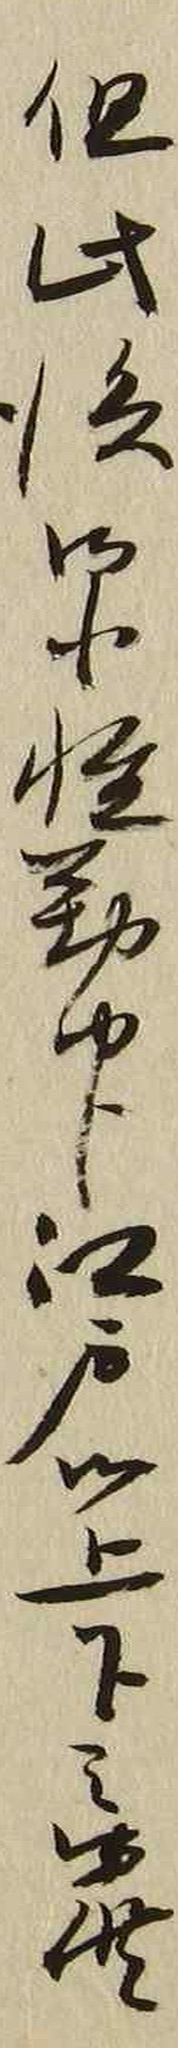但此後御小性勤中江戸御上下之御供
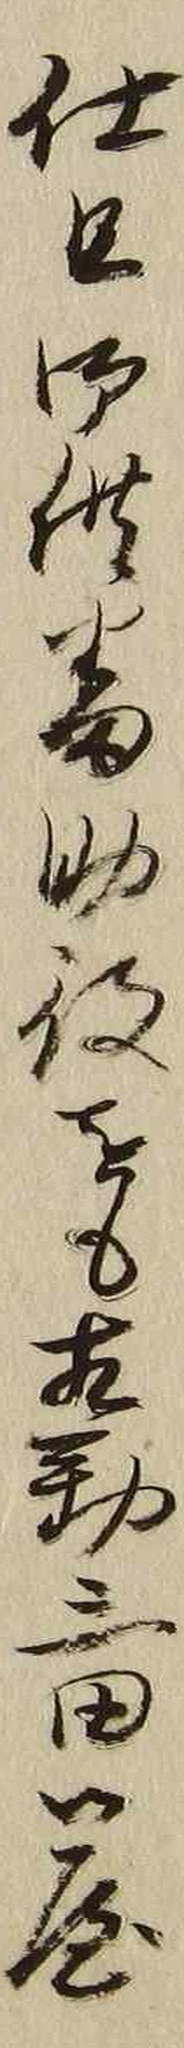仕且御供番助役をも相勤三田御屋
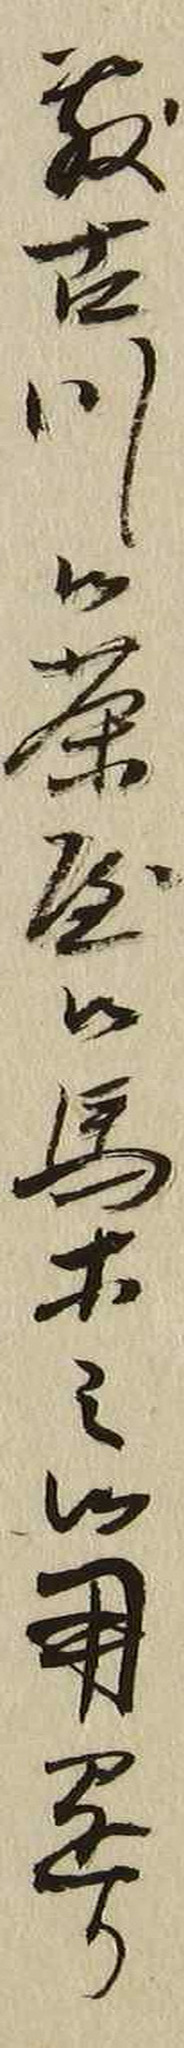敷古川御茶屋御馬等之御用懸り
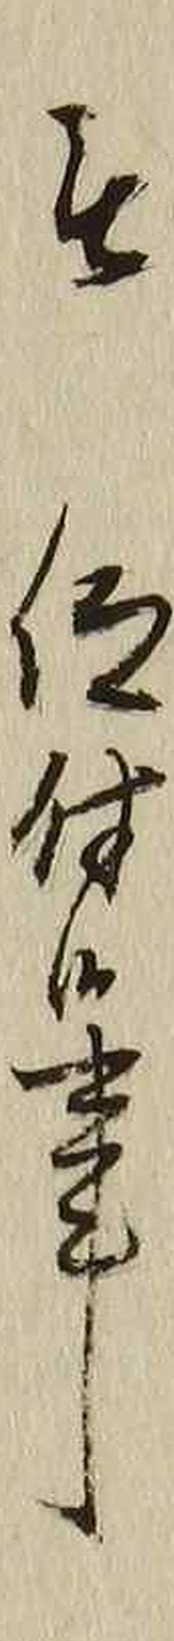被仰付候事
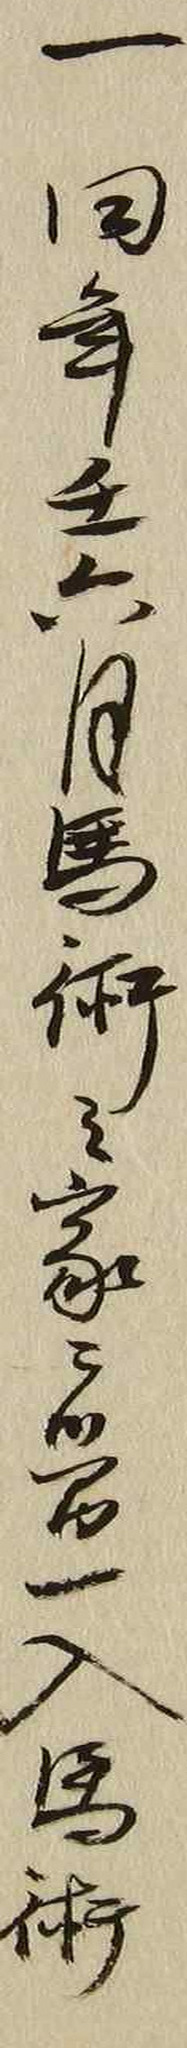一同年閏六月馬術之家ニ候間一入馬術
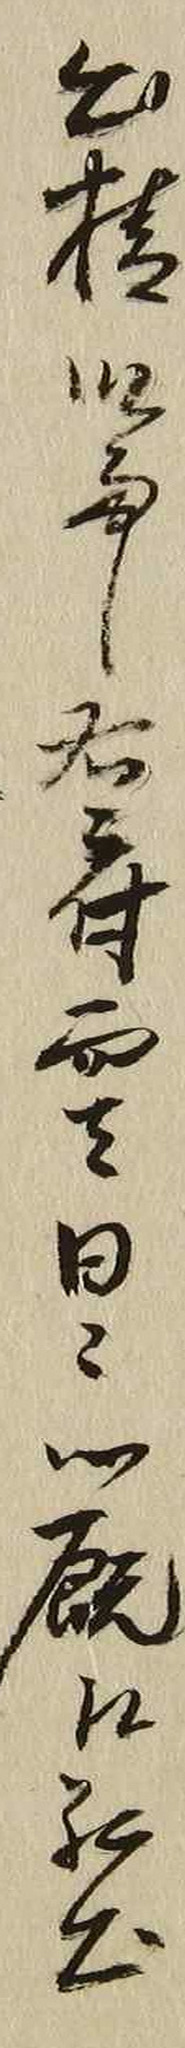出精いたし右ニ付而者日々御厩江罷出
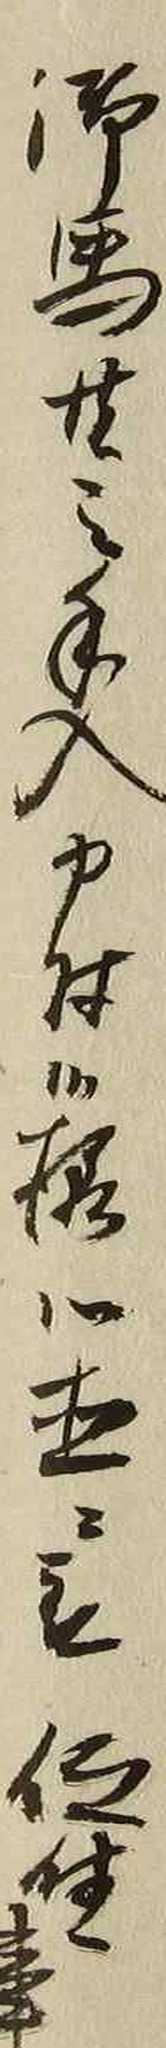御馬共之手入申付候様御直ニ被仰付候事
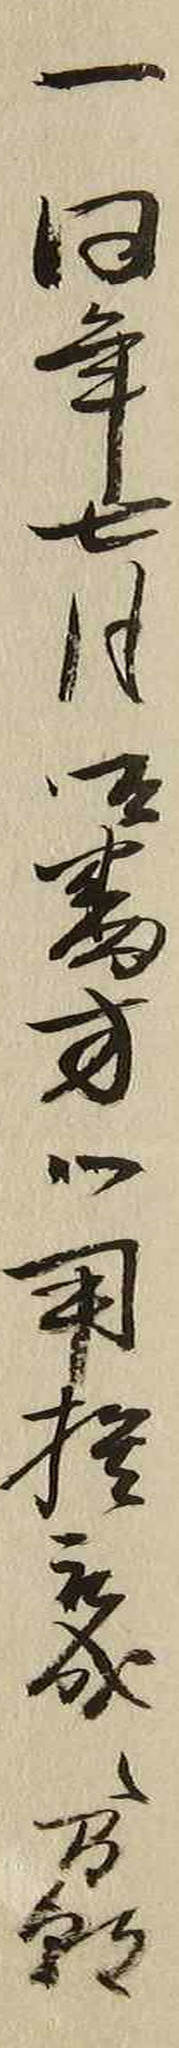一同年七月御番方御用捨被成候間朝
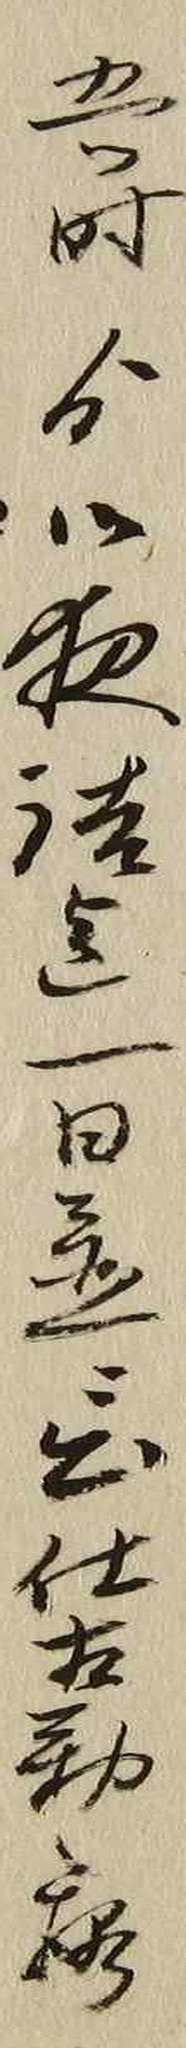五ツ時ゟ御夜詰迄一日置ニ出仕相勤候様
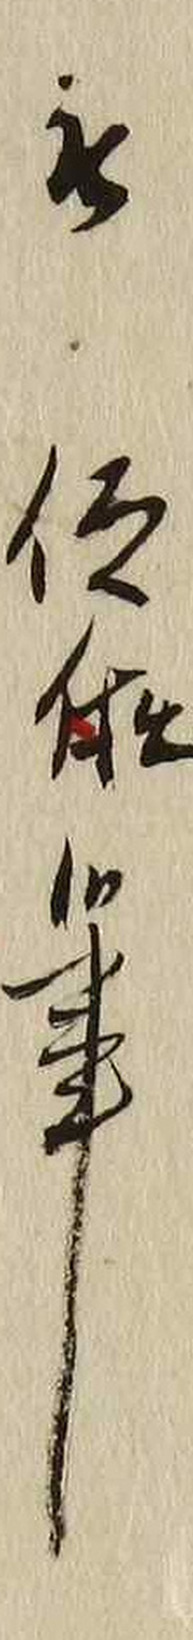被仰付候事
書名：諸士系譜　巻之345　も之部1
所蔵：会津若松市立会津図書館
